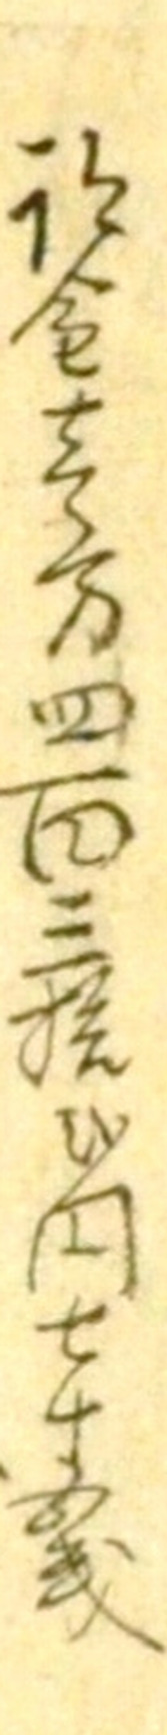跡金壱万四百三拾弐円七十五銭
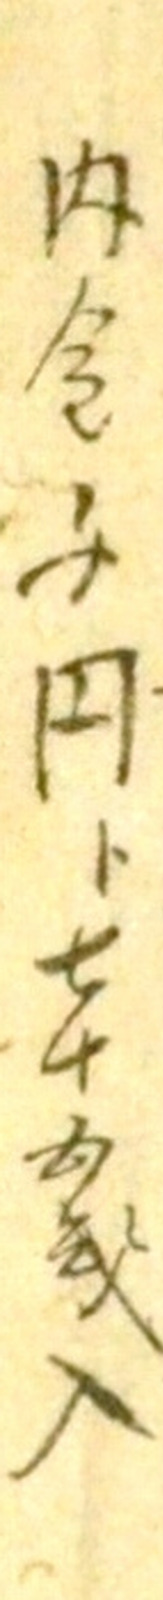内金千円ト七十五銭入

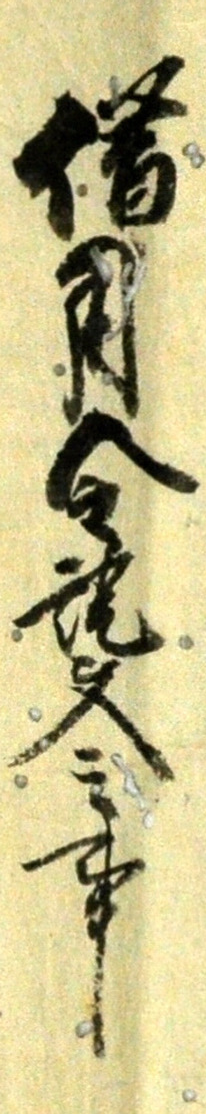借用金証文之事
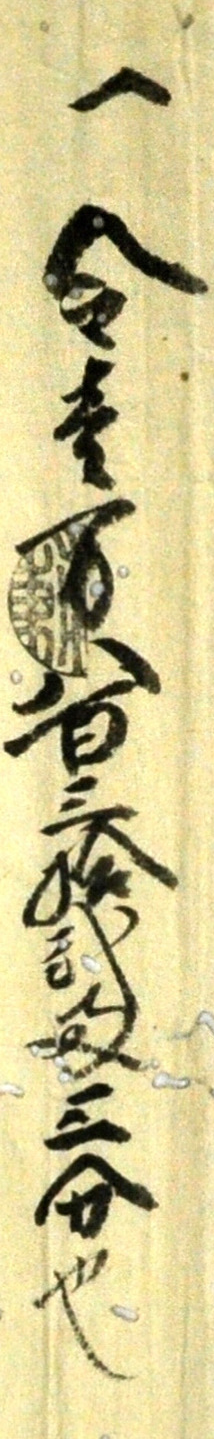一金壱万八百三拾弐両三分也
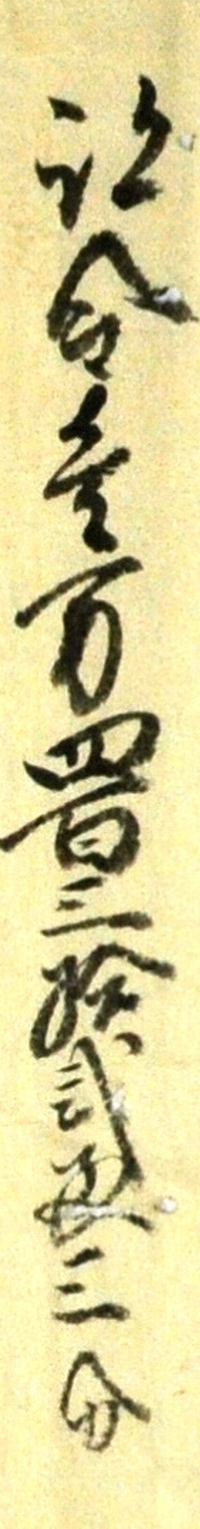跡金壱万四百三拾弐両三分
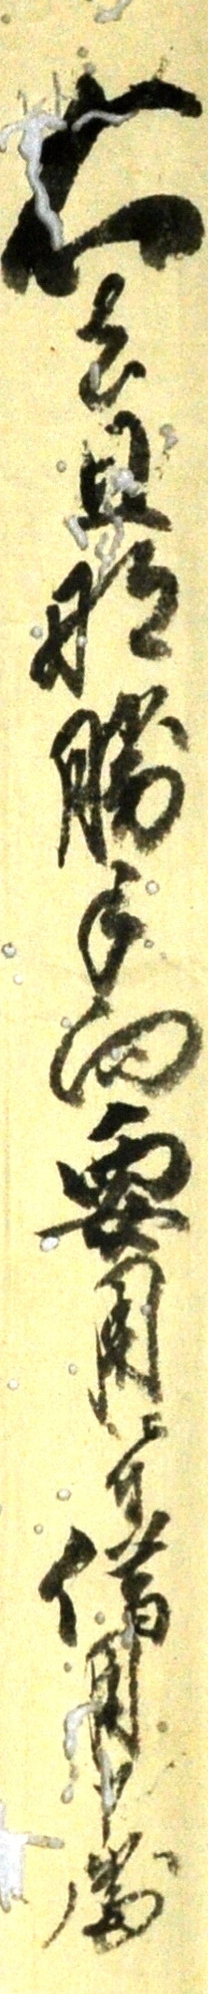右は旦那勝手向要用に付借用申処
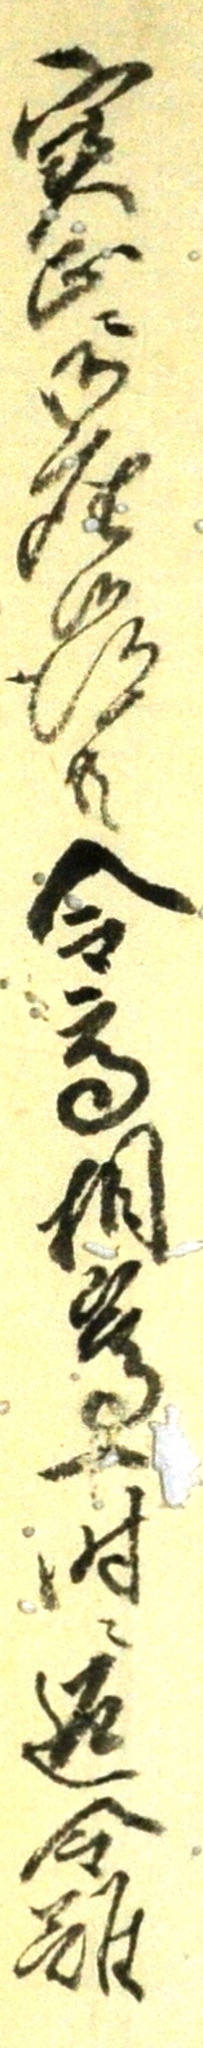実正に御座候得共金高相嵩一時に返金難
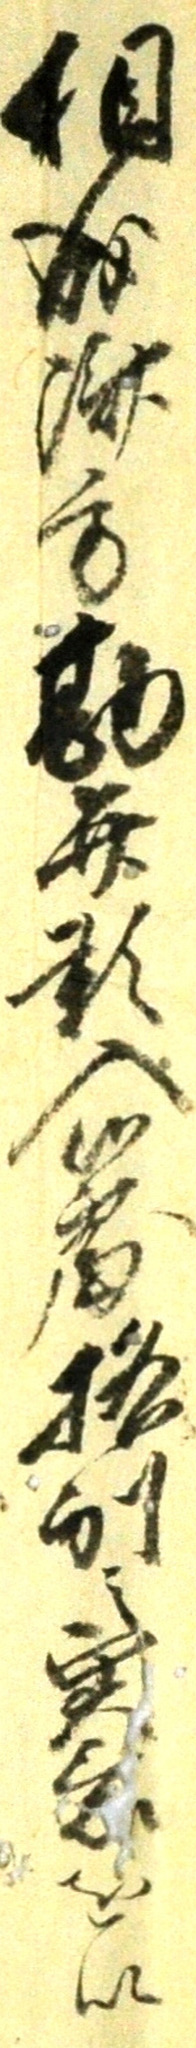相成済方勘弁頼入候処格別之実意を以
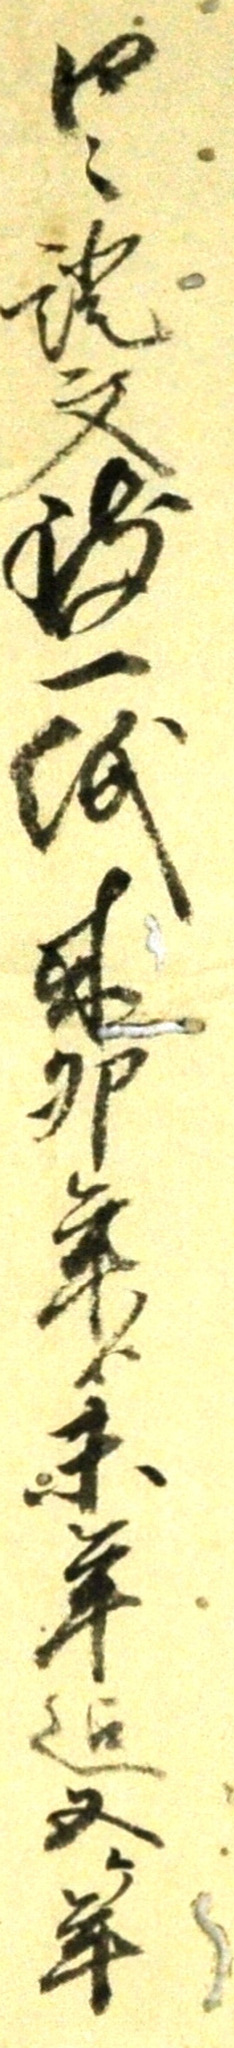口々証文致一紙来卯年ゟ未年迄五ヶ年
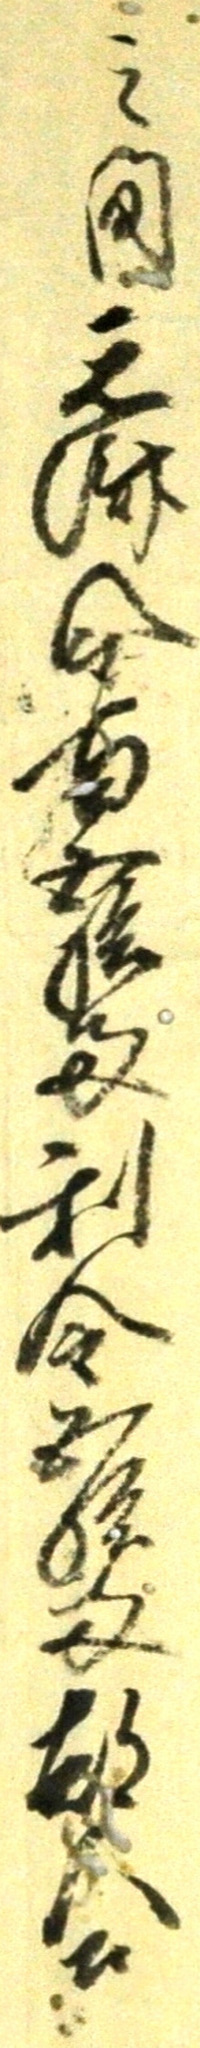之間元済金百五拾両李金五拾両都合
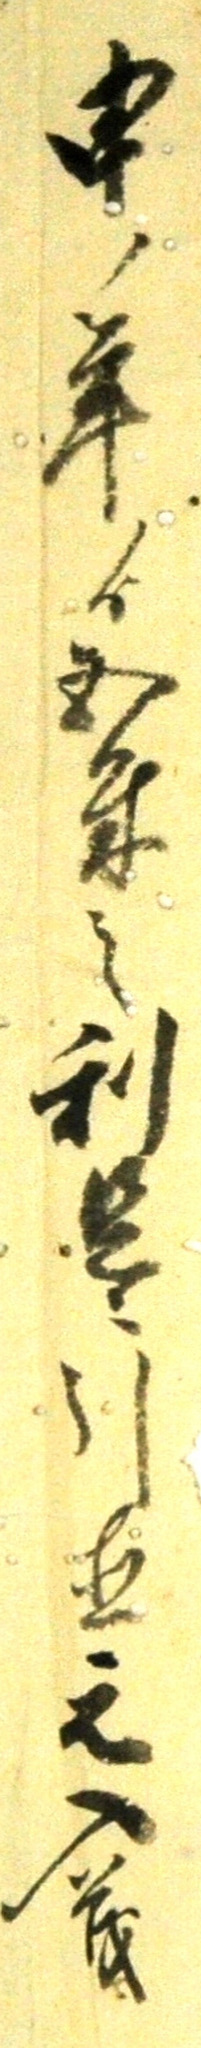申ノ年ゟ五朱之利足に引直元入も
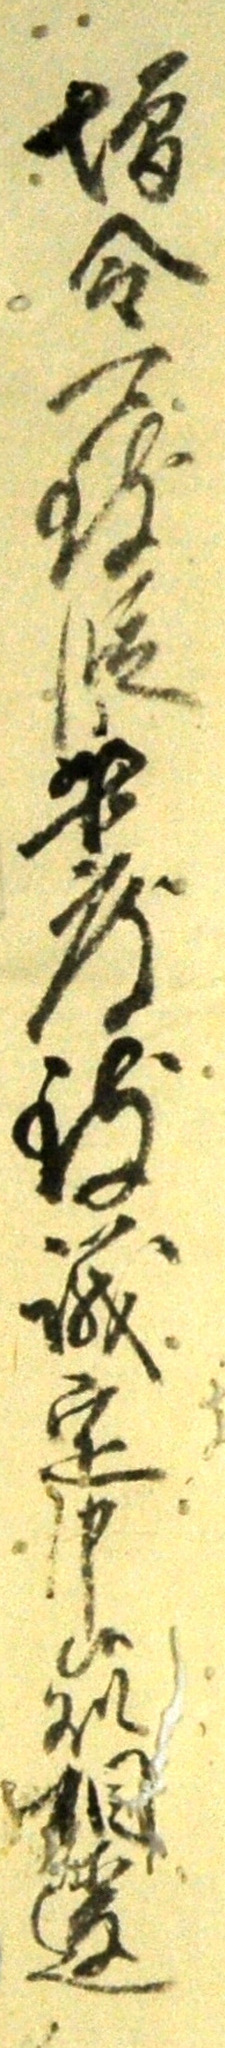増金可致段此度致議定申候処相違
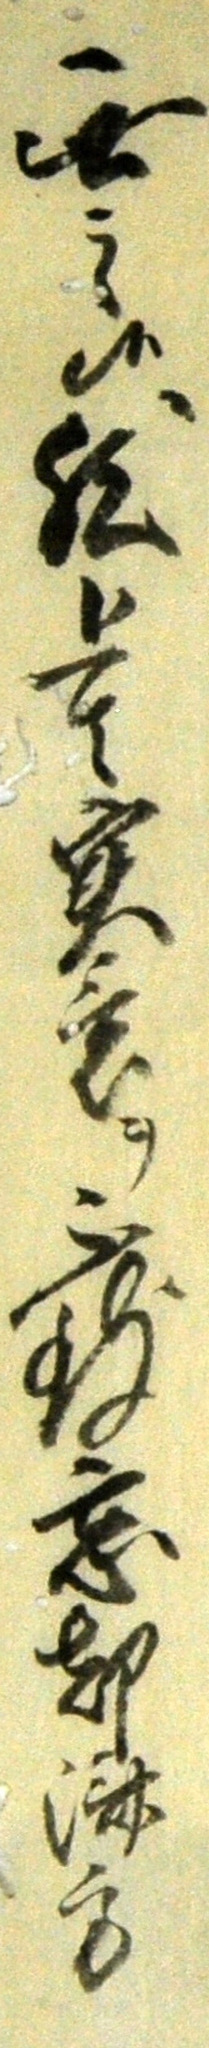無之候然上は実意ヲ不致忘却済方

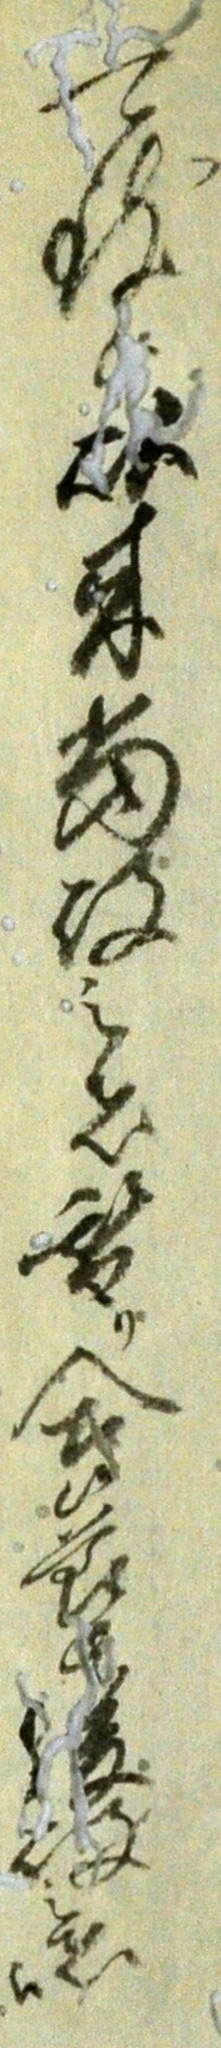可致候以来当役之者替り合候節は後役之者え
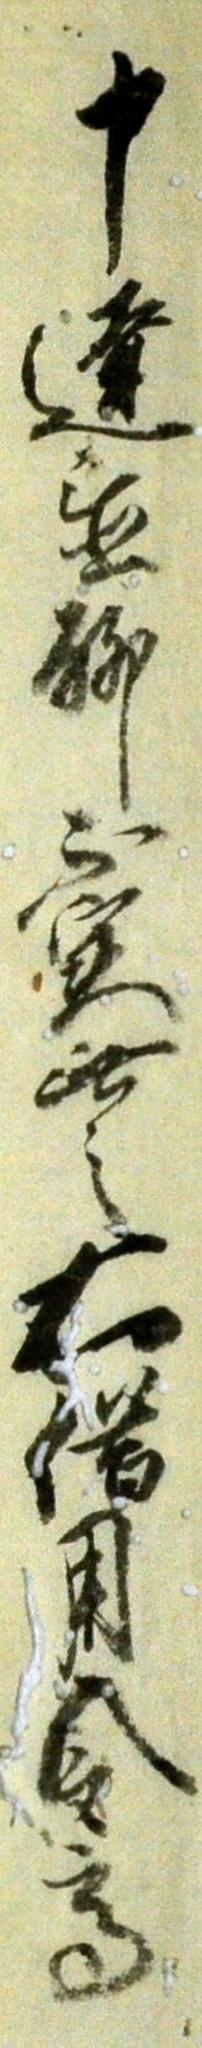申達置聊不実無之右借用金高
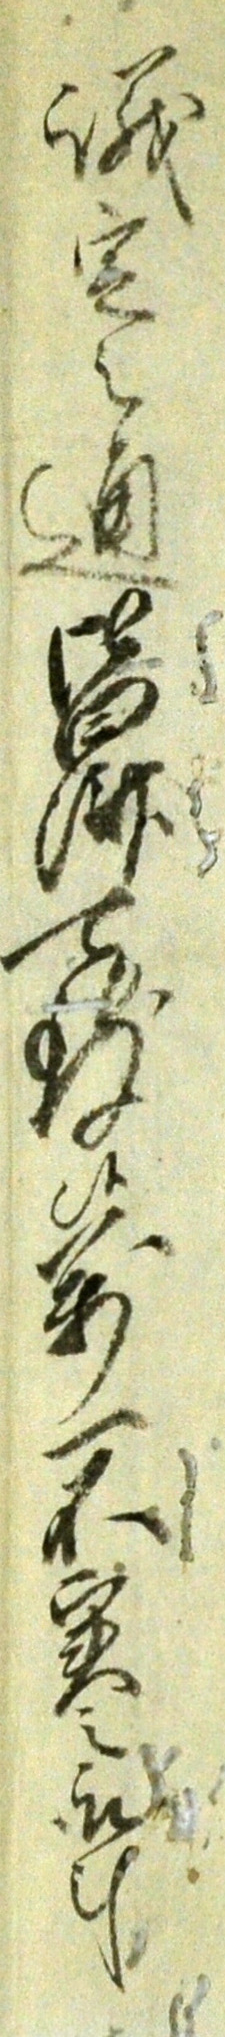議定之通皆済可致候万一不実之取斗
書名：借用金証文之事
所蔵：伊那市立高遠町図書館・合同会社AMANE
